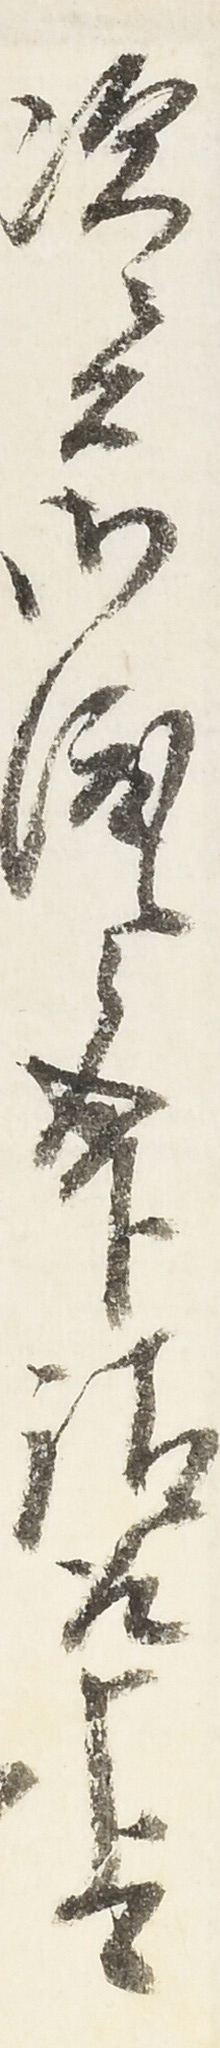次ニ而御渡被成下請取申上候
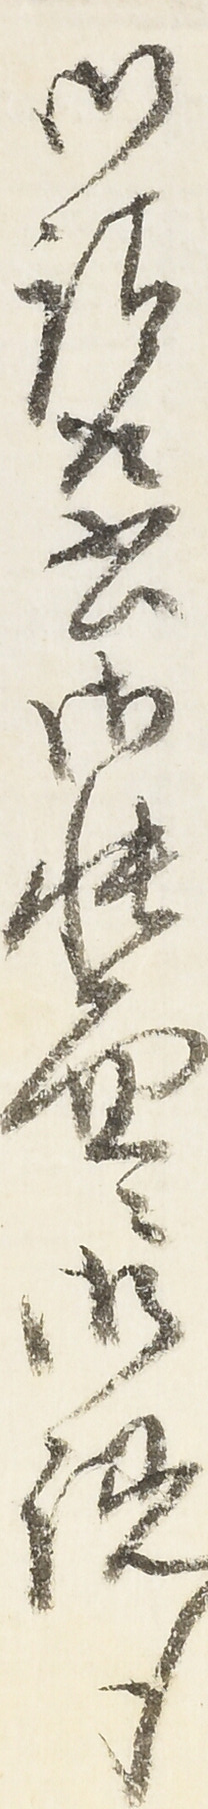御請取書御帳面ニ御認メ
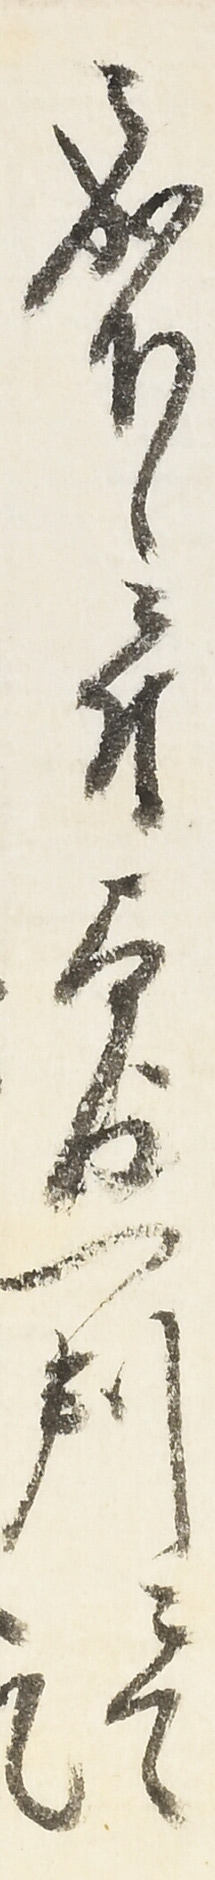被成下候ニ付与右衛門一判ニて
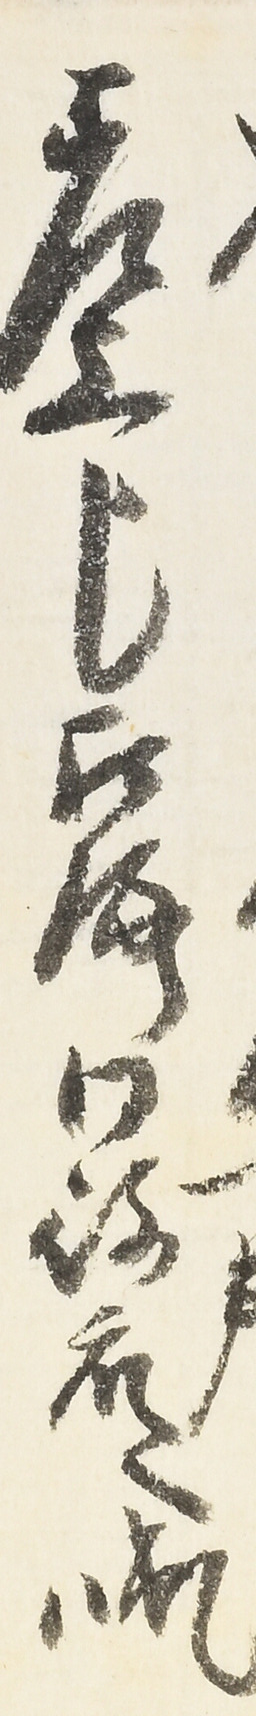差上申候罷帰り御役衆へ咄候
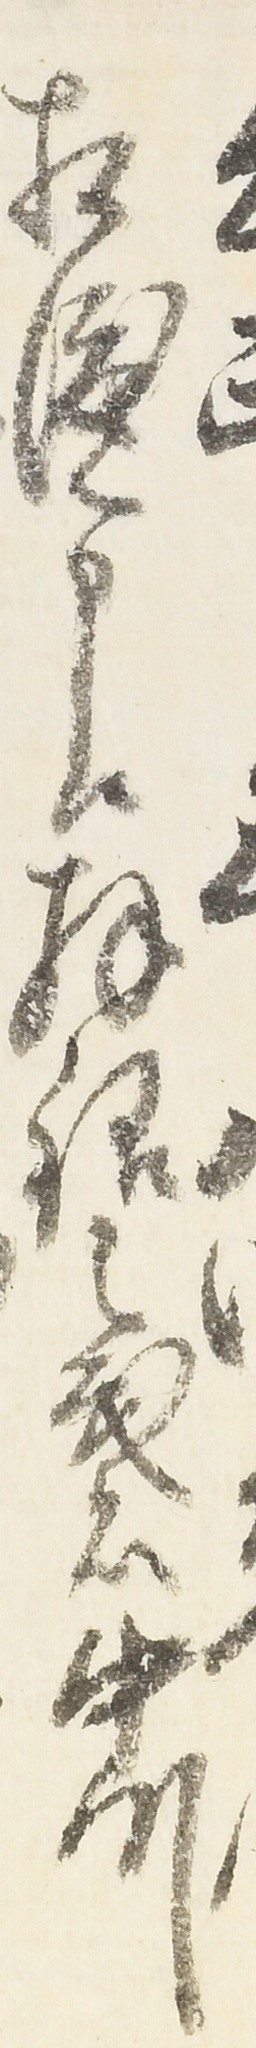相渡し申候拝銀之義者中町
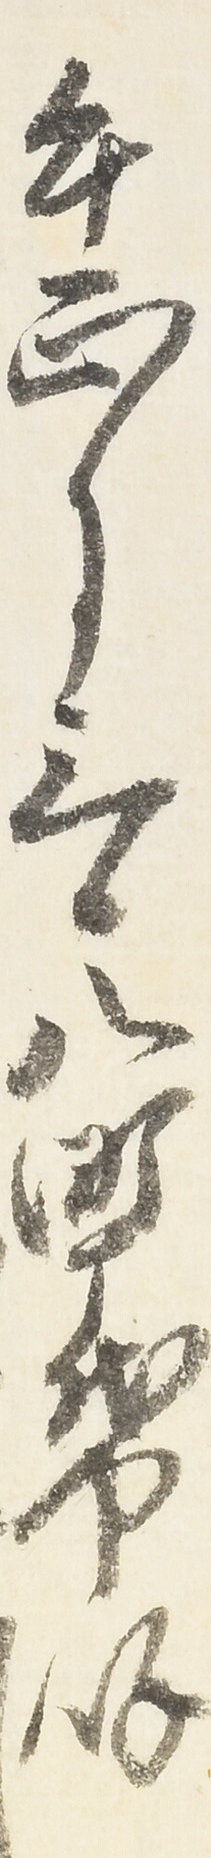午正月三日八町丁代中呼
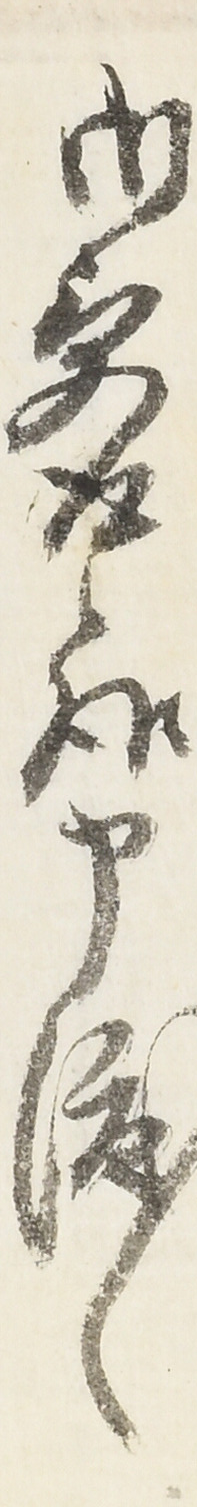御受取候様申渡候
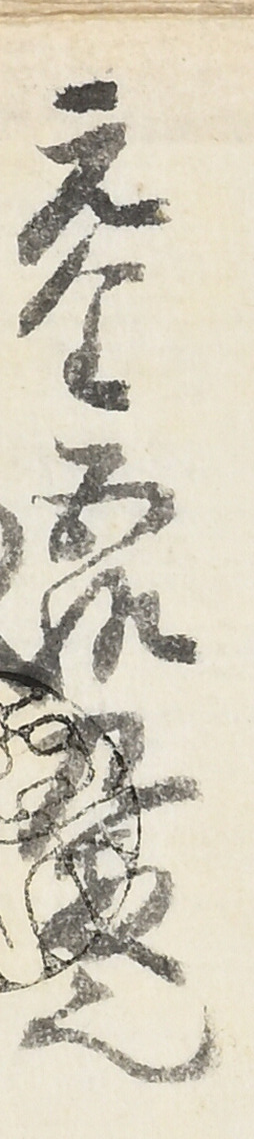元金五拾両也
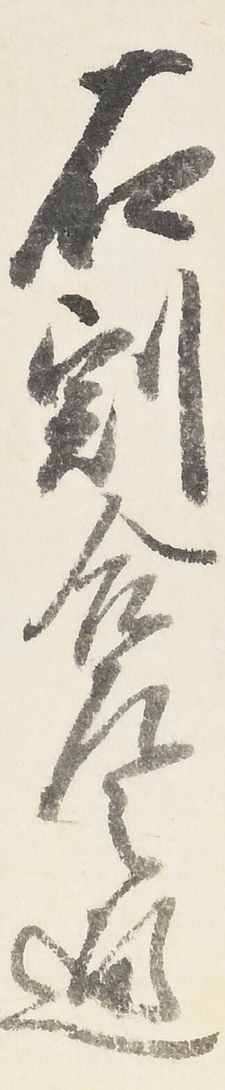右割合左之通
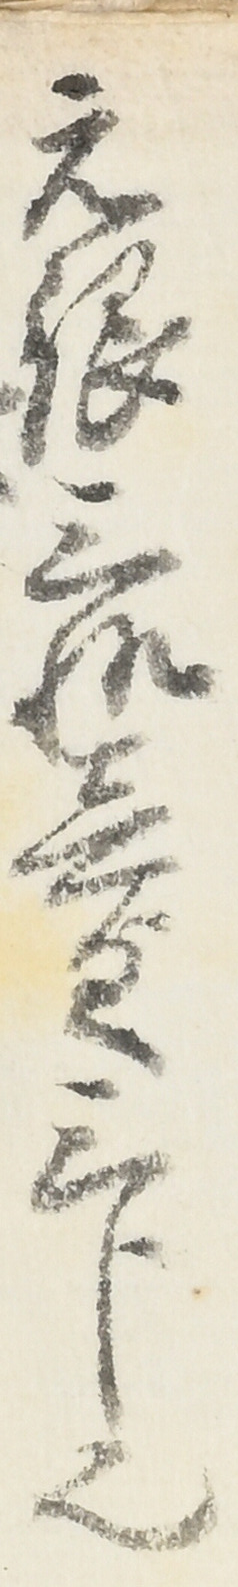元銀三拾壱匁三分也
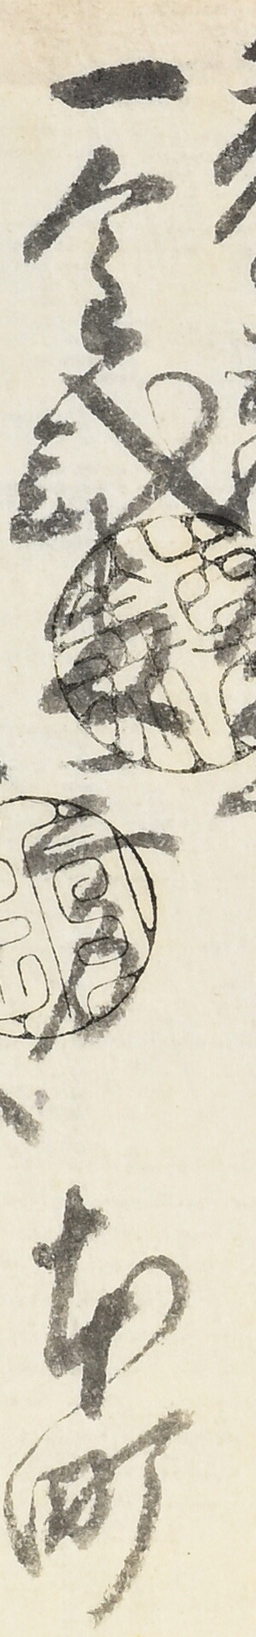一金弐両三分本町
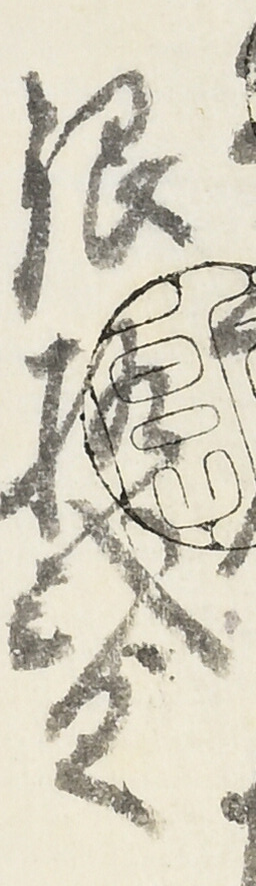銀拾弐匁
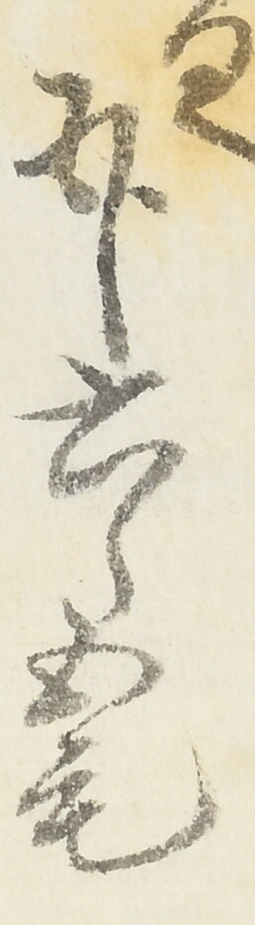五分六厘五毛

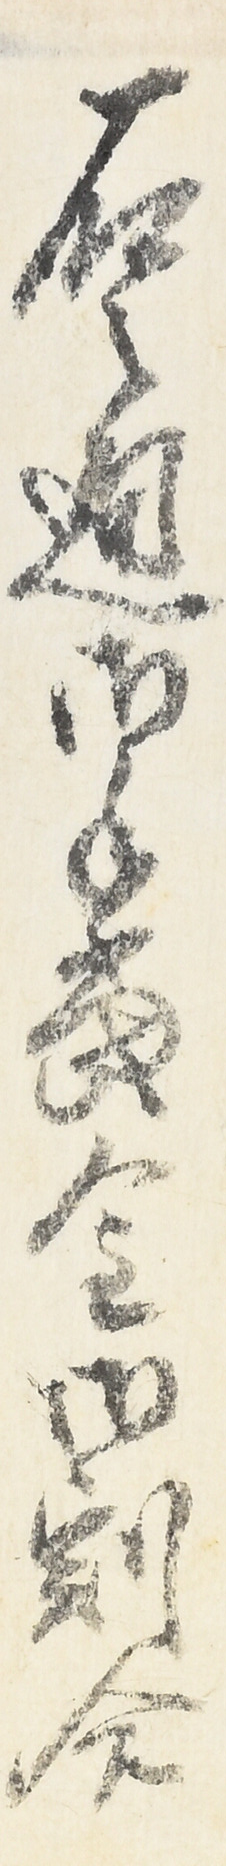右之通御手当金御割合
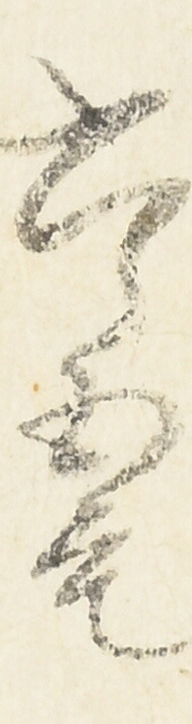六厘五毛
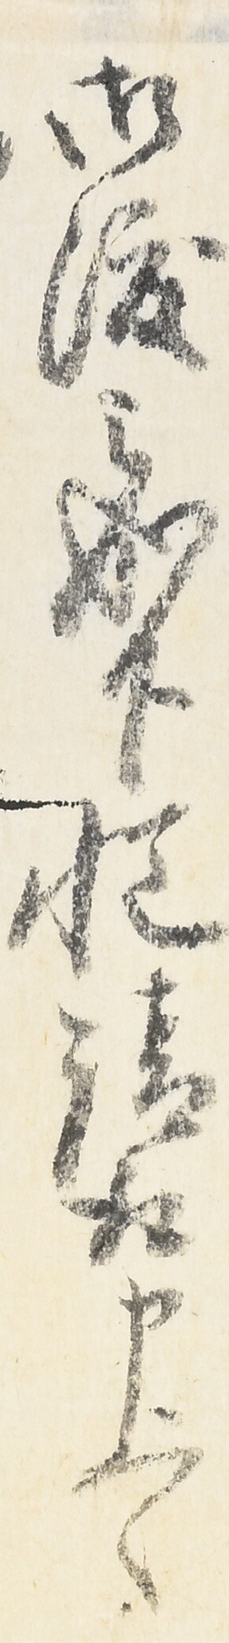御渡被成下慥請取申上候
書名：御才覚金御利足割渡扣帳
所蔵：伊那市立高遠町図書館・合同会社AMANE
